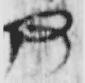尹
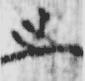之
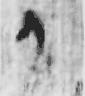人
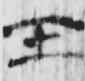壬
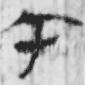午
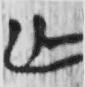亡
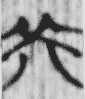癸
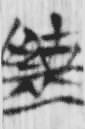○（盬）
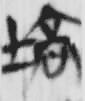塙
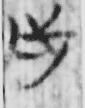戌
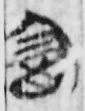酓（熊）
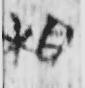相
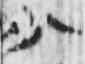少
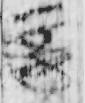妾
